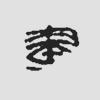建
